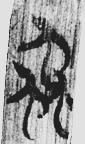蟲
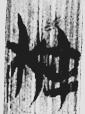材
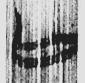㠯（以）
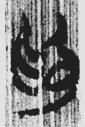爲
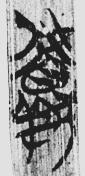獻
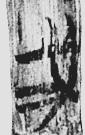或
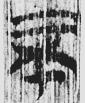不
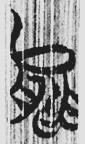能
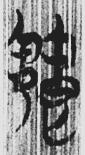節
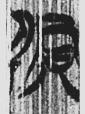○（處）
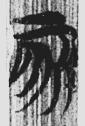所
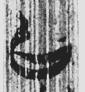㠯（以）
